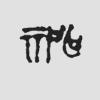神
